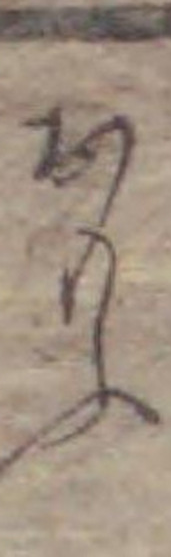おもふ

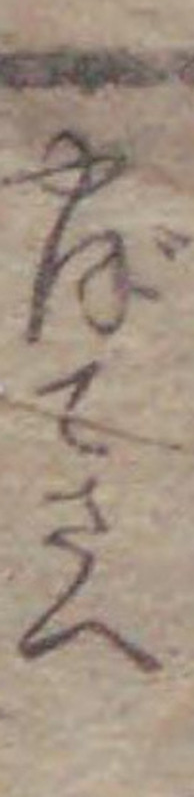やぼてさへ
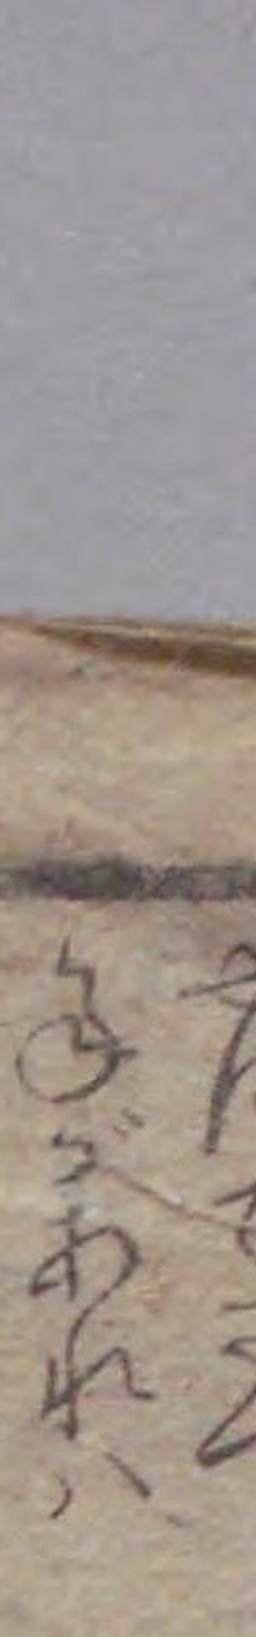かねがあれは
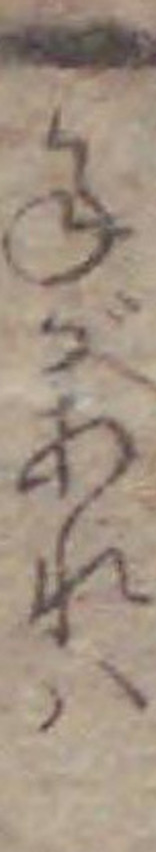かねがあれは
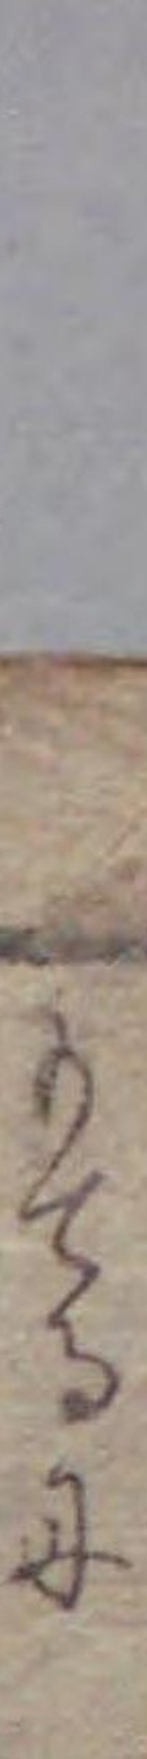もてるに
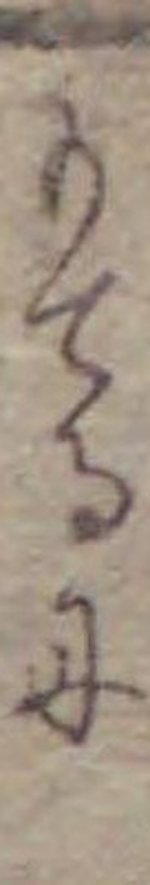もてるに
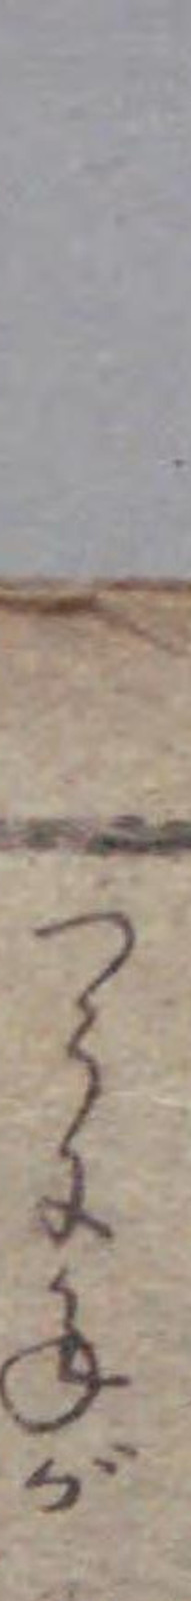つうにかねが
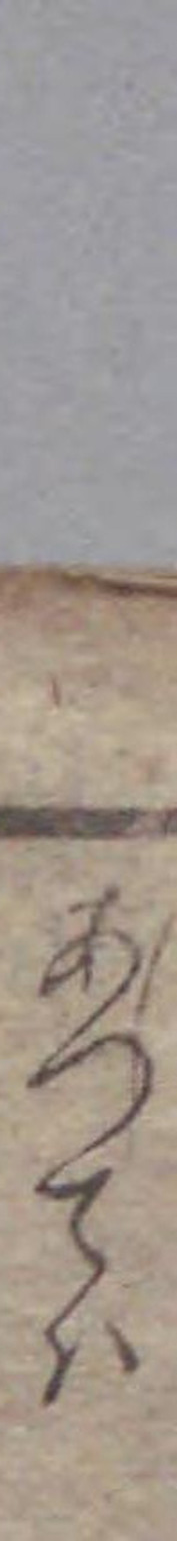あつては
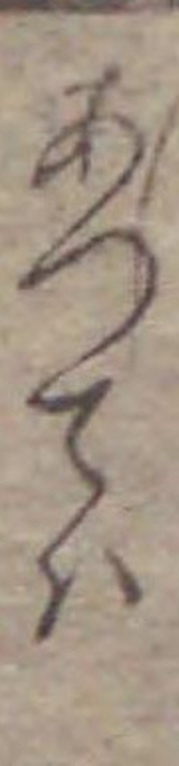あつては
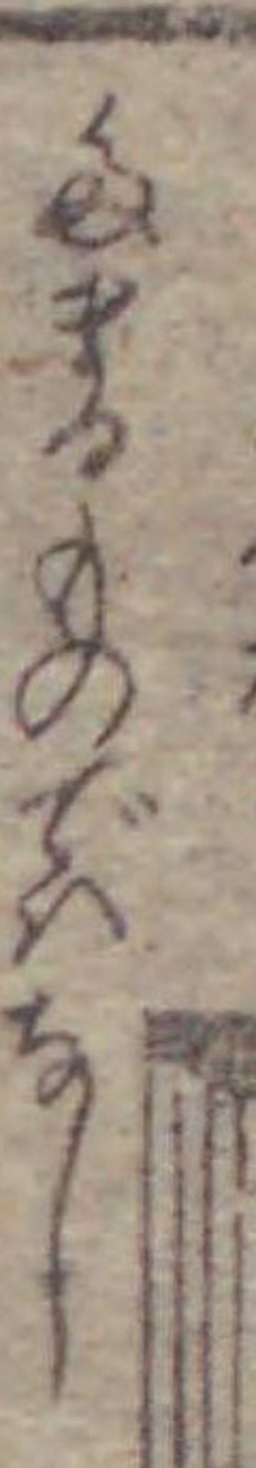たまるものではなし
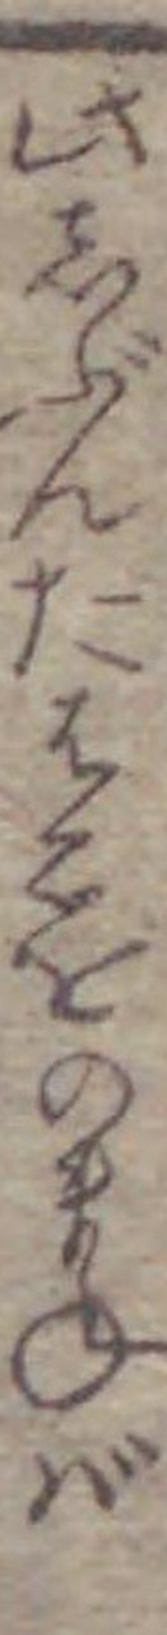此しぶんたはこをのまねば
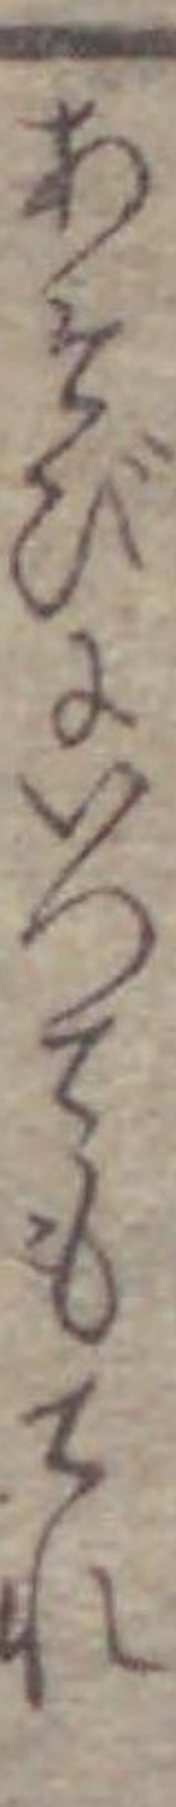あそびにいつてもこれ
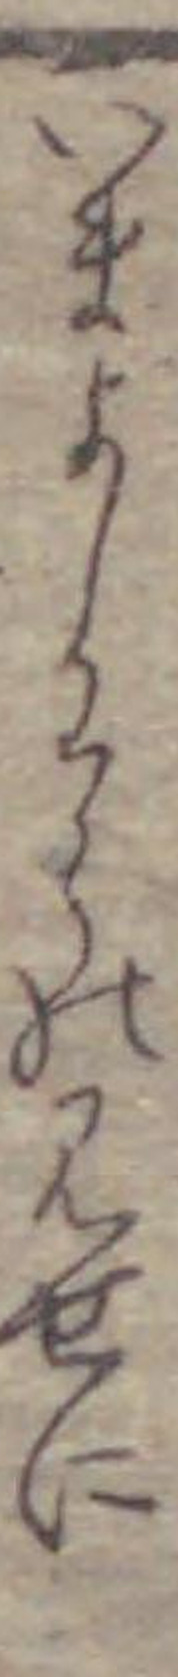いまよしわらのみせに
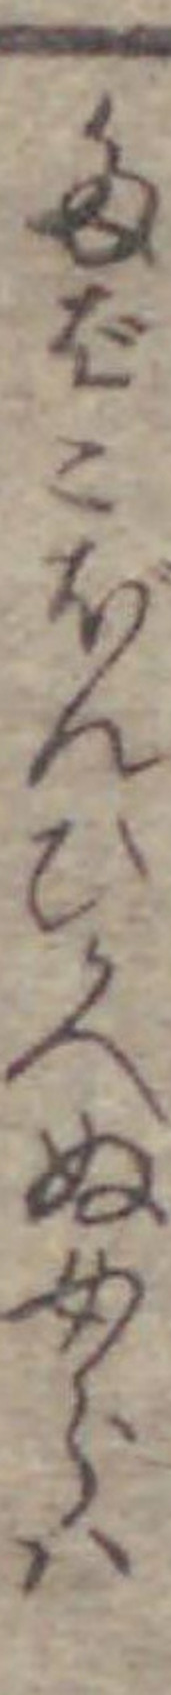たばこぼんひかへぬ女郎は
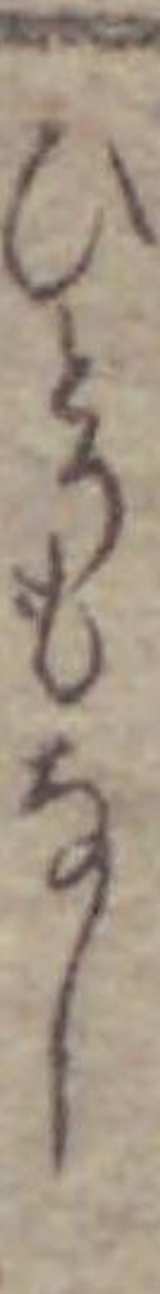ひとりもなし
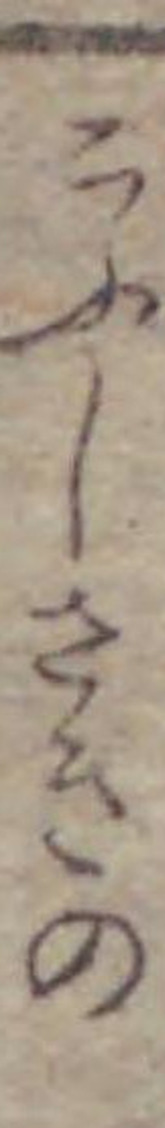こふしさきの
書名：談芭菰誉詞 : 3巻
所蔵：国立国会図書館 National Diet Library, JAPAN
